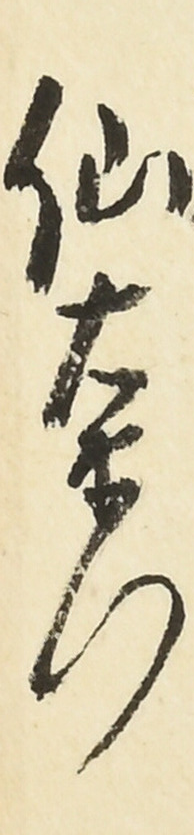仙右衛門

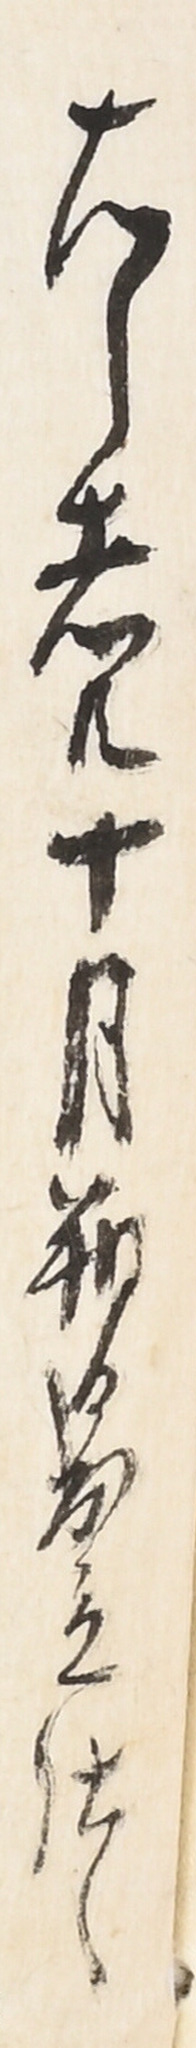右之者共十月朔日出立仕候
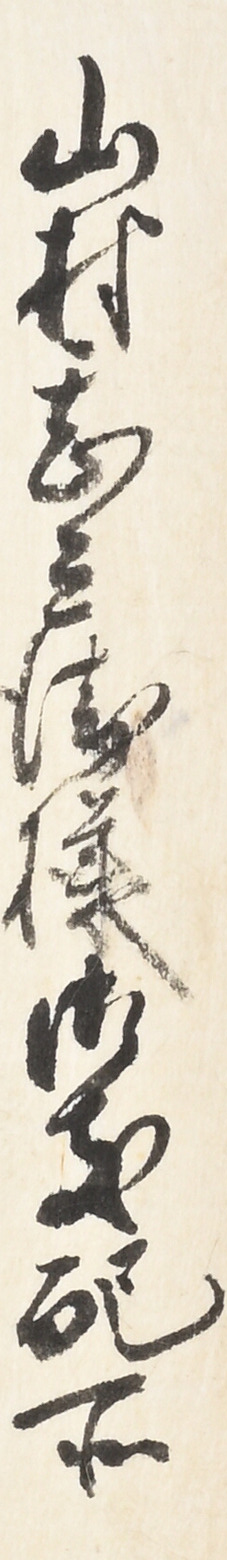山村甚兵衛様御支配所
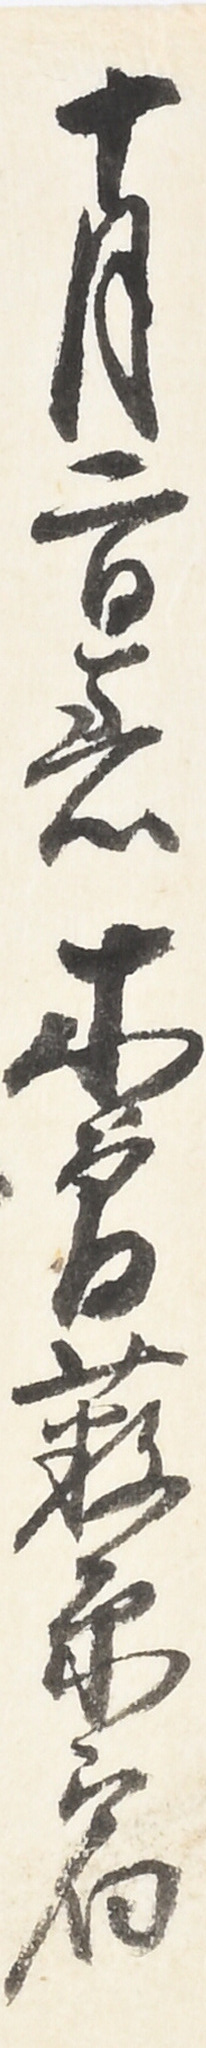十月二日着木曽藪原宿
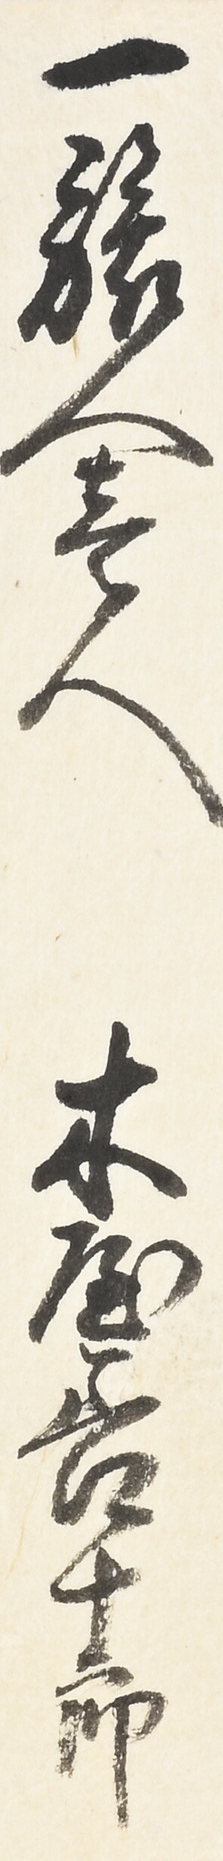一旅人壱人木屋善十郎
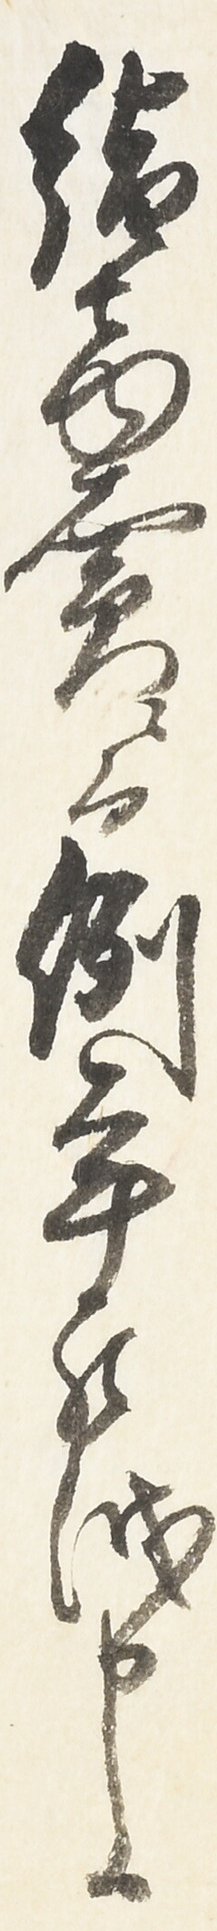絹商売ニ而例年罷越申候
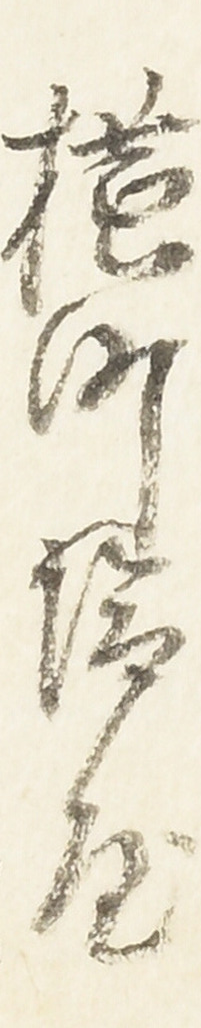横町塩屋
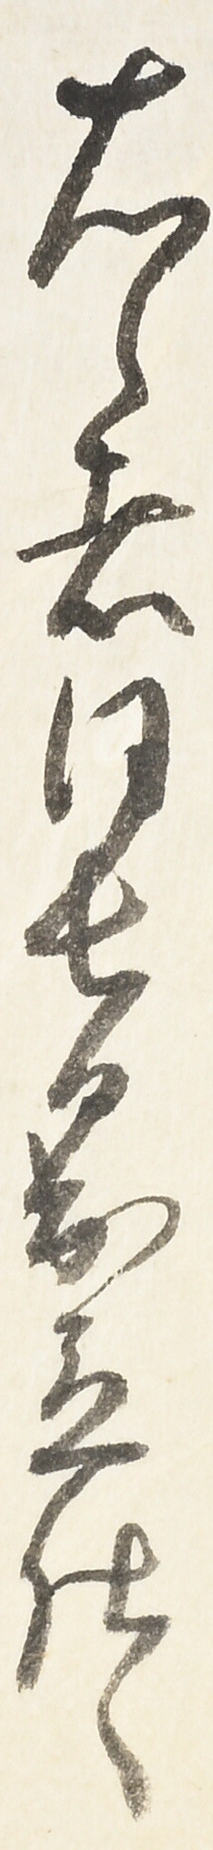右之者同七日出立仕候
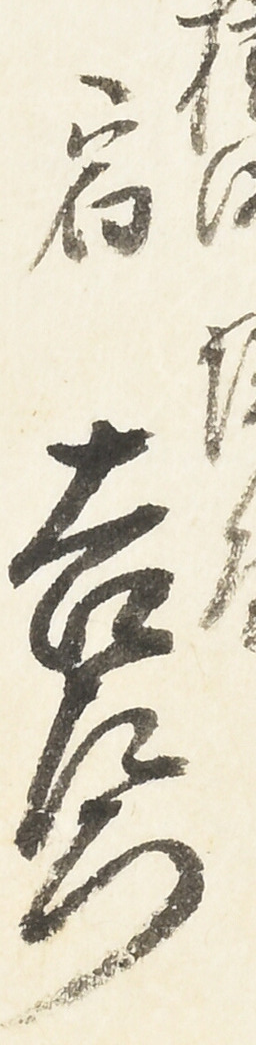宿吉左衛門
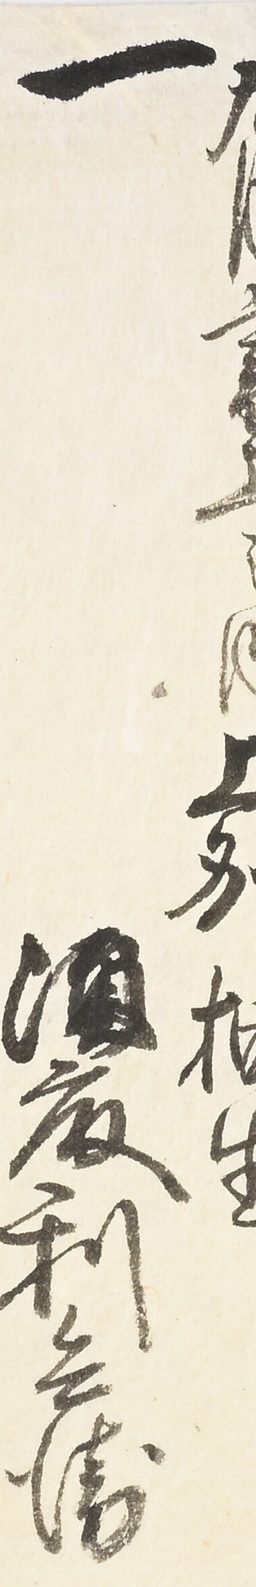一次藤利兵衛
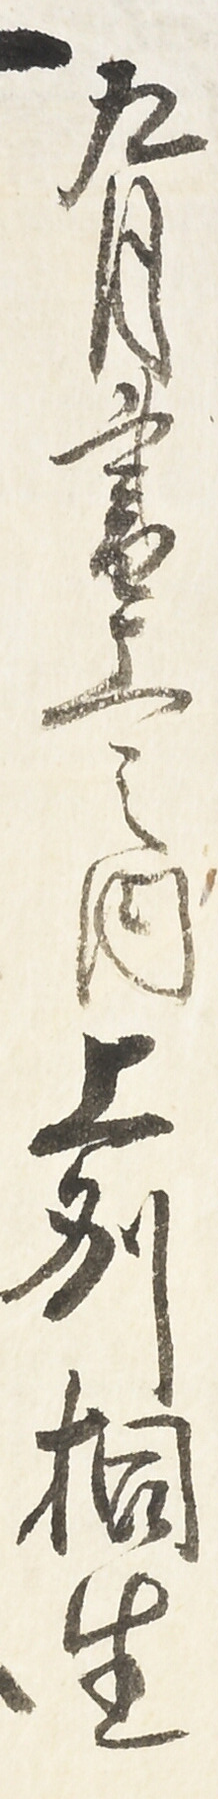九月書上之内上州桐生
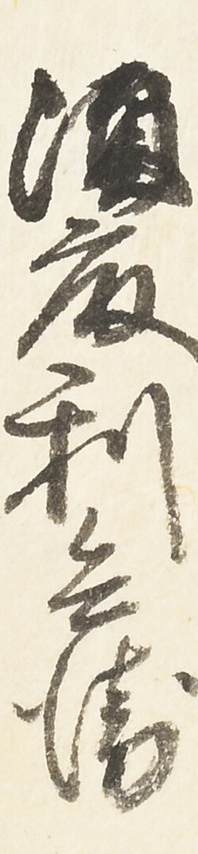一次藤利兵衛
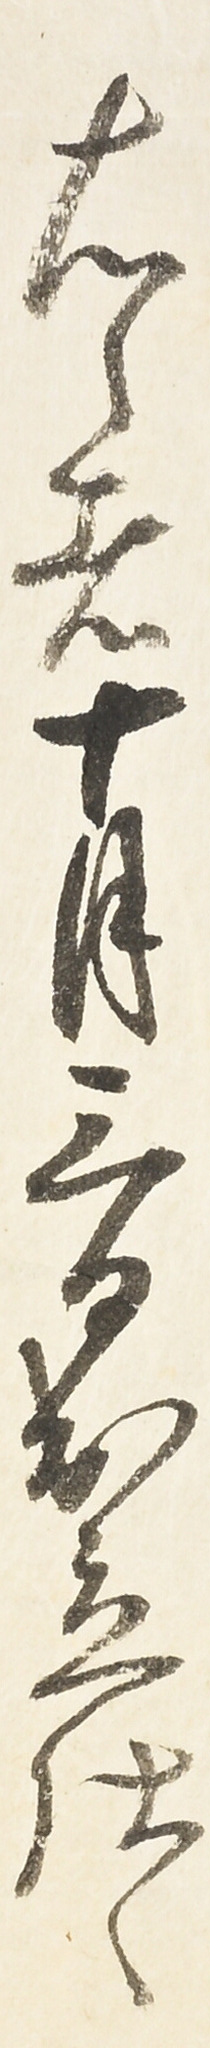右之者十月三日出立仕候
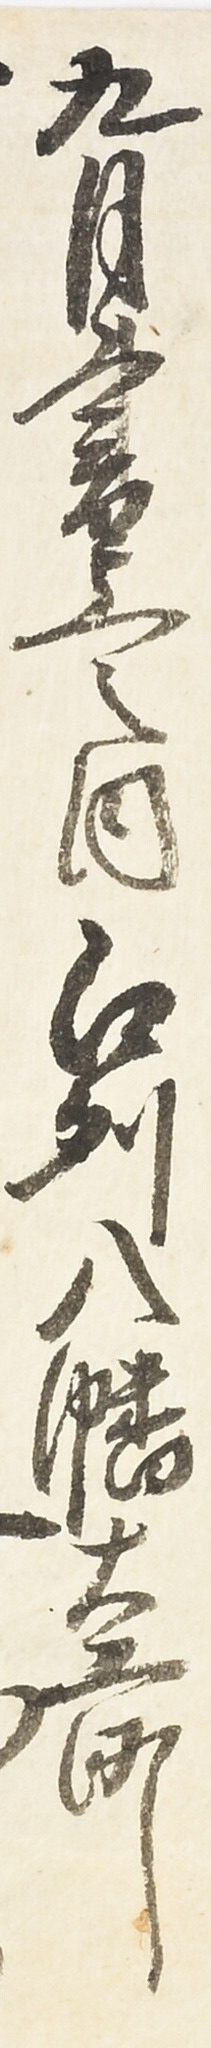九月書上之内江州八幡大工町
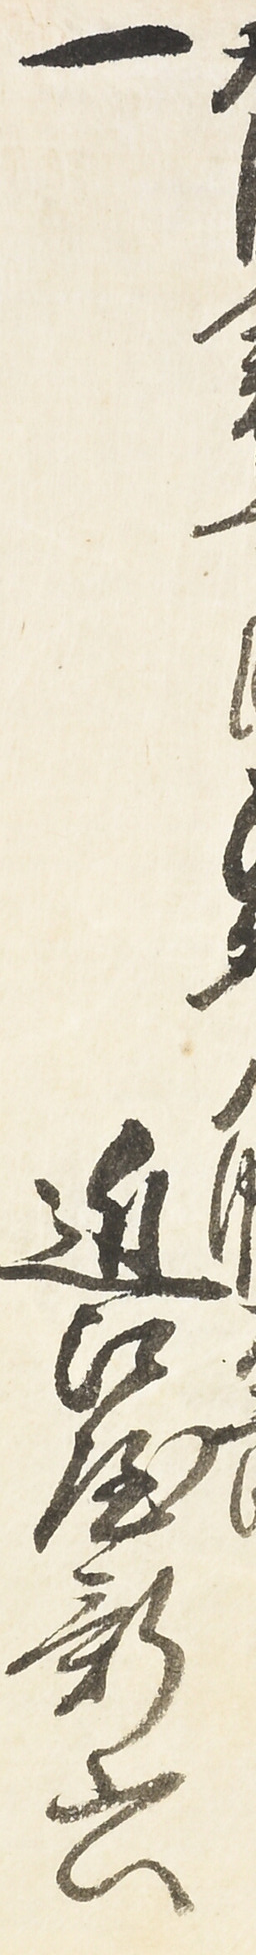一近江屋新六
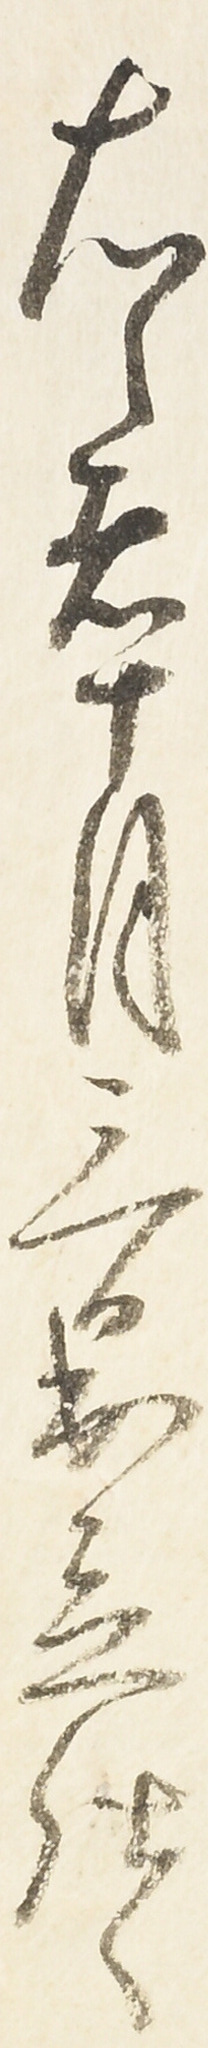右之者十月三日出立仕候
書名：町中旅人泊控帳
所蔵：伊那市立高遠町図書館・合同会社AMANE
